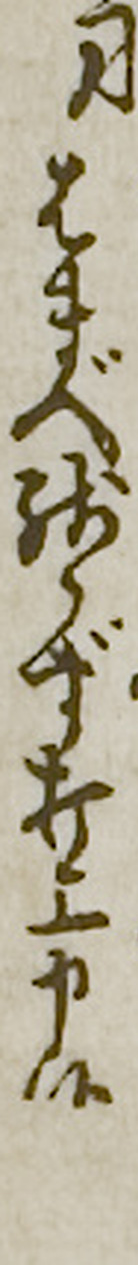はまべ残らず打上申候
